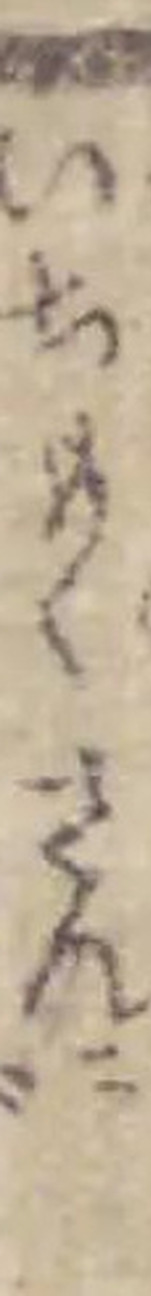いちもくさんに
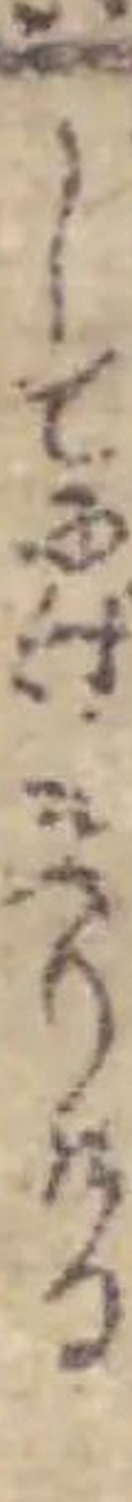してにげかへりける

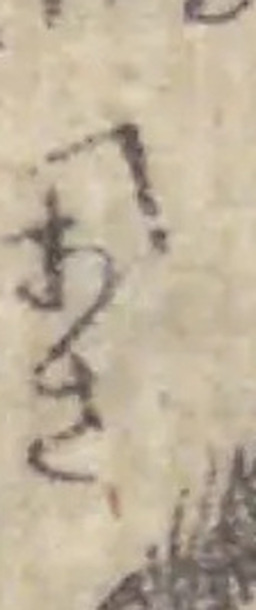〽あさ
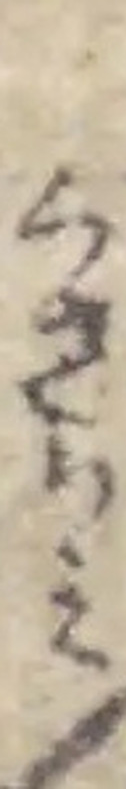くさかみ
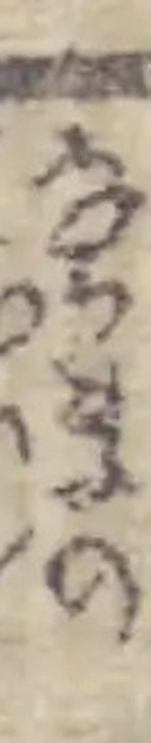なかまの
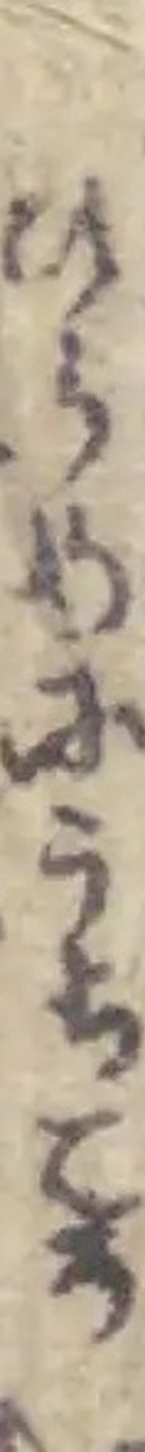ひらめにうちころ
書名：化物尽 4巻
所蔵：国立国会図書館 National Diet Library, JAPAN
